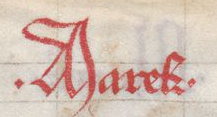.Marek.
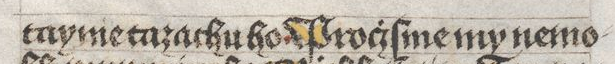tayme tazachu ho. Procż ſme my nemo¬
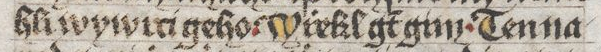hli wywrci geho? Y rekl ḡt gím.Ten na¬
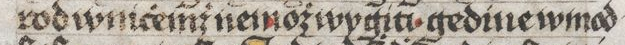rod.w niċemż nemoż wygiti.gedine wmod¬
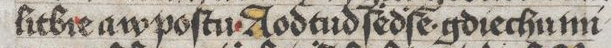litbe a w poſtu.A odtud ẛedẛe.gdíechu mi¬
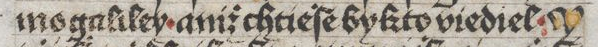mo galiley.aníž chtíeẛe by kto viediel.Y
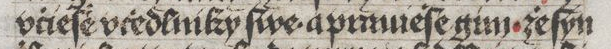vċíeẛe vċedlníky ſwe.a prauíeẛe gím że ſyn
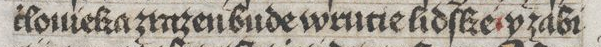ċlouieka zrazen bude vrutíe lidſke.y zabi¬
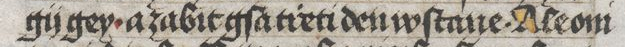gij gey.a zabit gſa tṙetí den wſtane. Ale oni
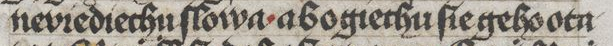nevíedíechu ſlowa.a bogíechu ſie geho ota¬
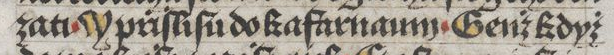zati.Y pṙiẛli ſu do kafarnaum.Genż kdyż
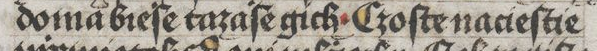doma bieẛe tazaẛe gich.Czoſte na cieſtie
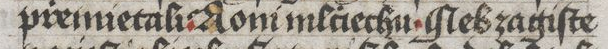pṙemietali.A oni mlċíechu.Neb za gíſte
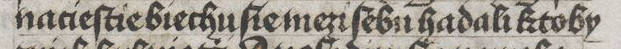na cíeſtie bíechu ſie mezí ſebu hadali ktoby
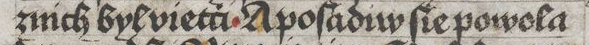z ních byl víetċí. A poſadiw ſie powola
